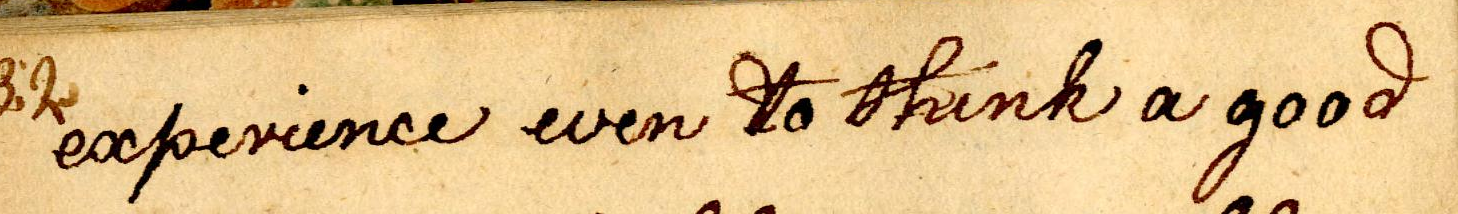experience even to think a good
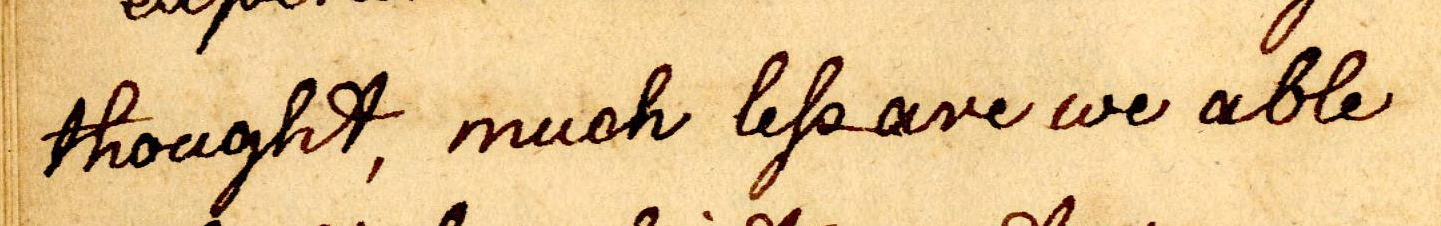thought, much less are we able
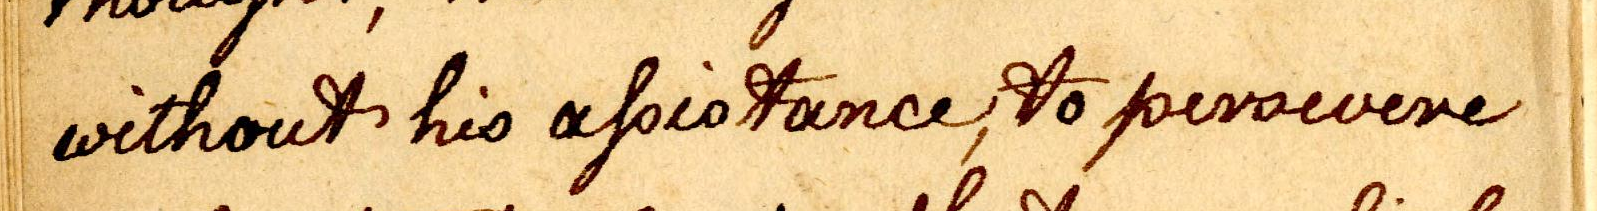without his assistance, to persevere
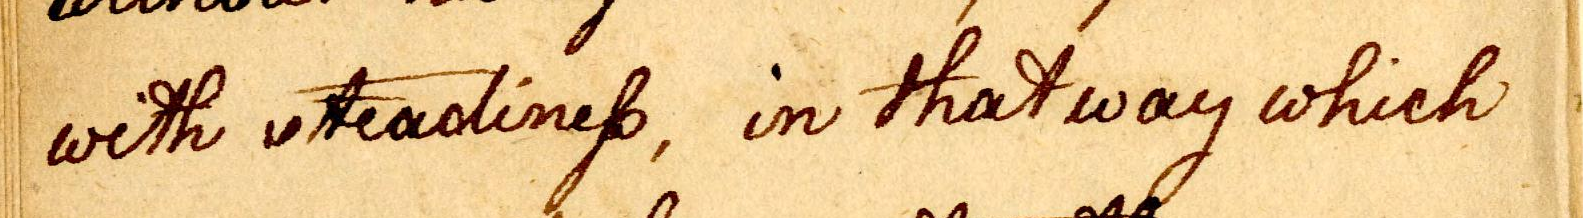with steadiness, in that way which
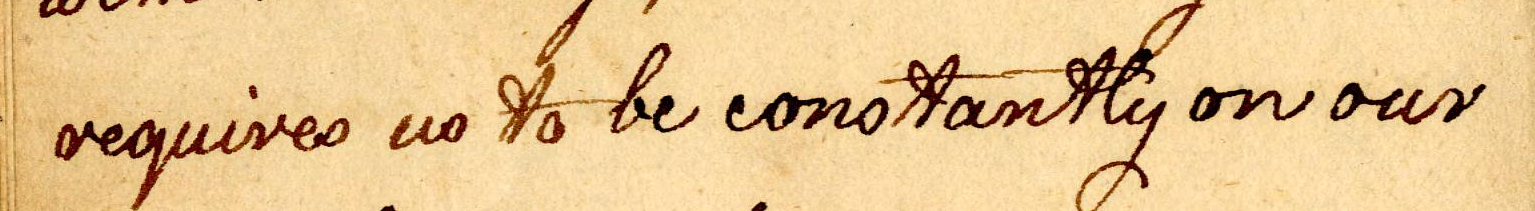requires us to be constantly on our
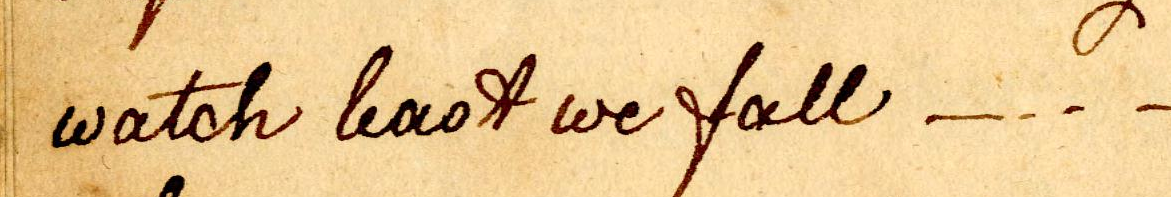watch least we fall-
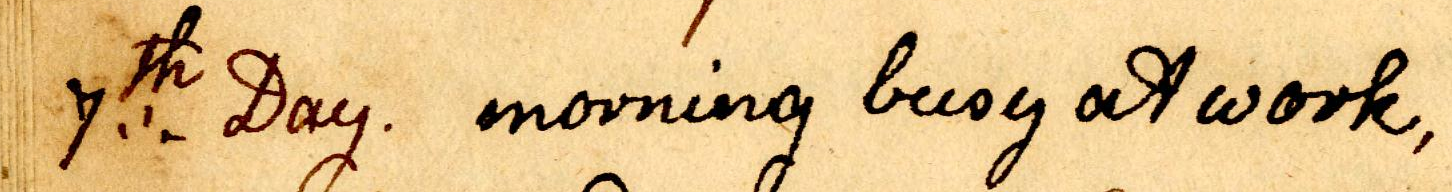7^th Day morning busy at work,
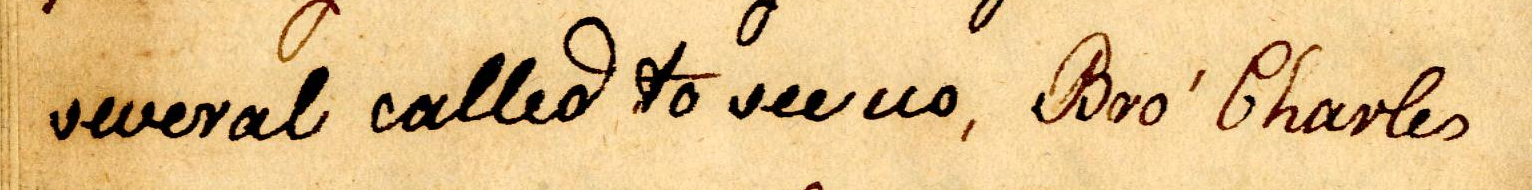several called to see us, Bro' Charles
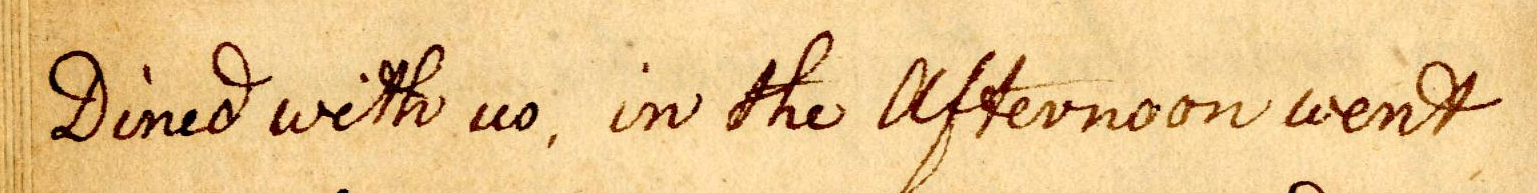Dined with us, in the Afternoon went
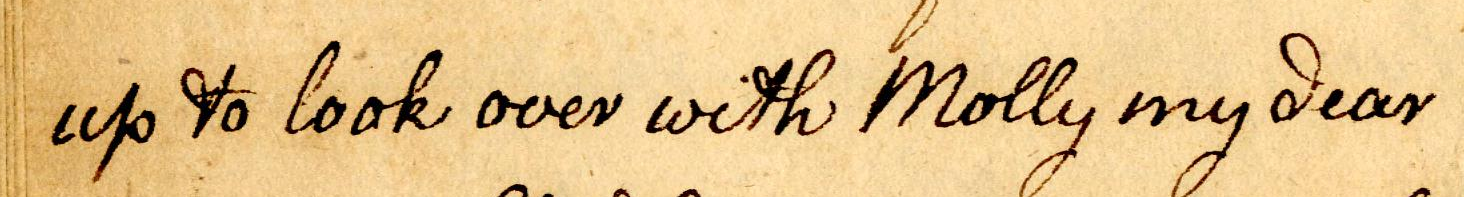up to look over with Molly my dear
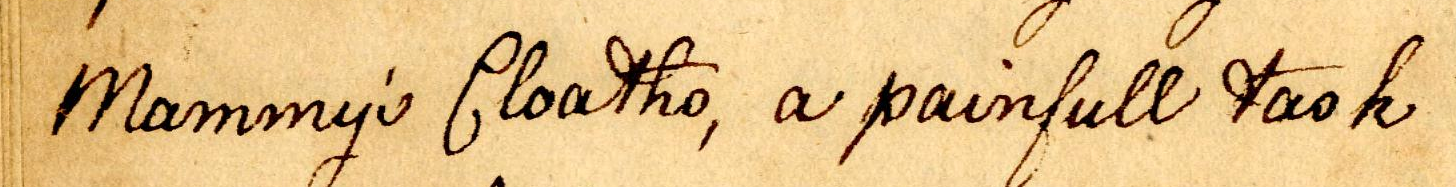Mammy's Cloaths, a painfull task
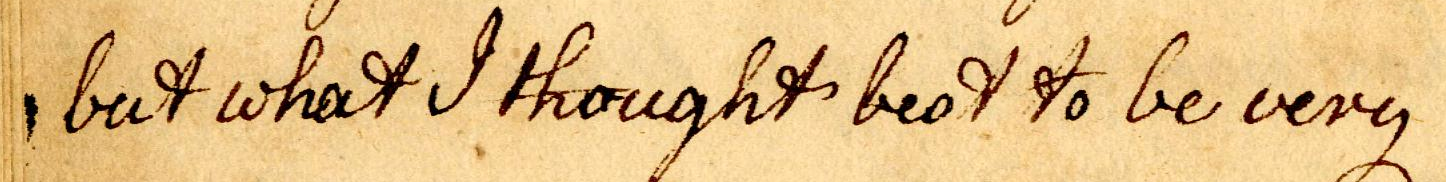but what I thought best to be very
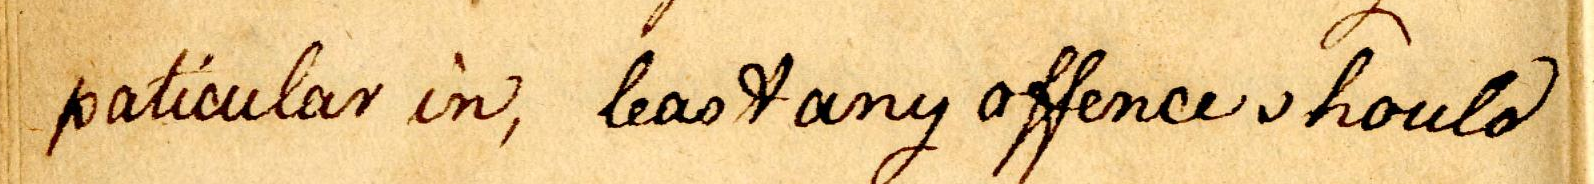paticular in, least any offence should
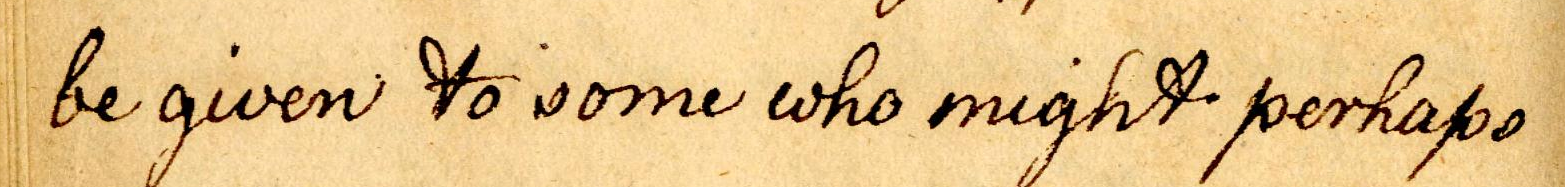be given to some who might perhaps
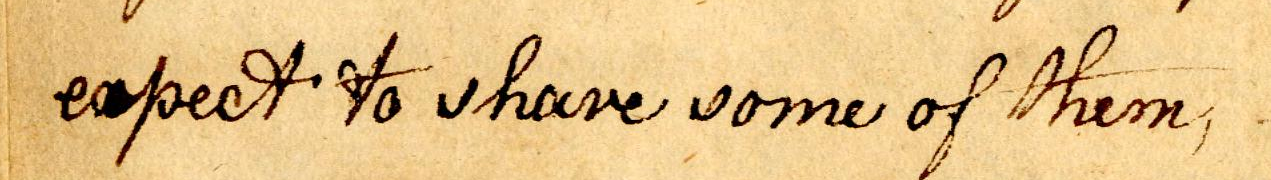expect to share some of them,
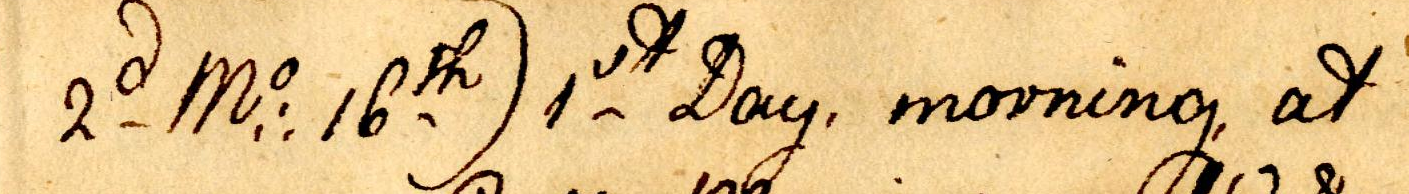2^d M^o 16^th Day. morning, at
